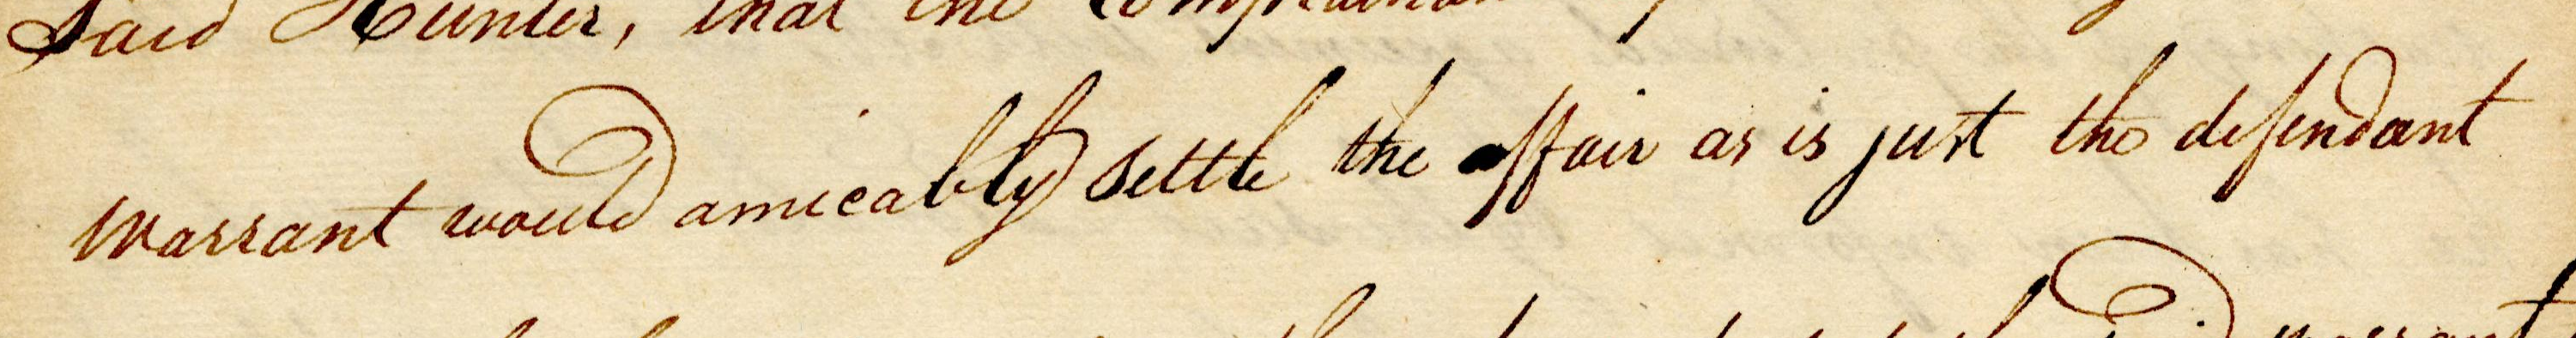warrant would amiably settle the affair as is just the defendant
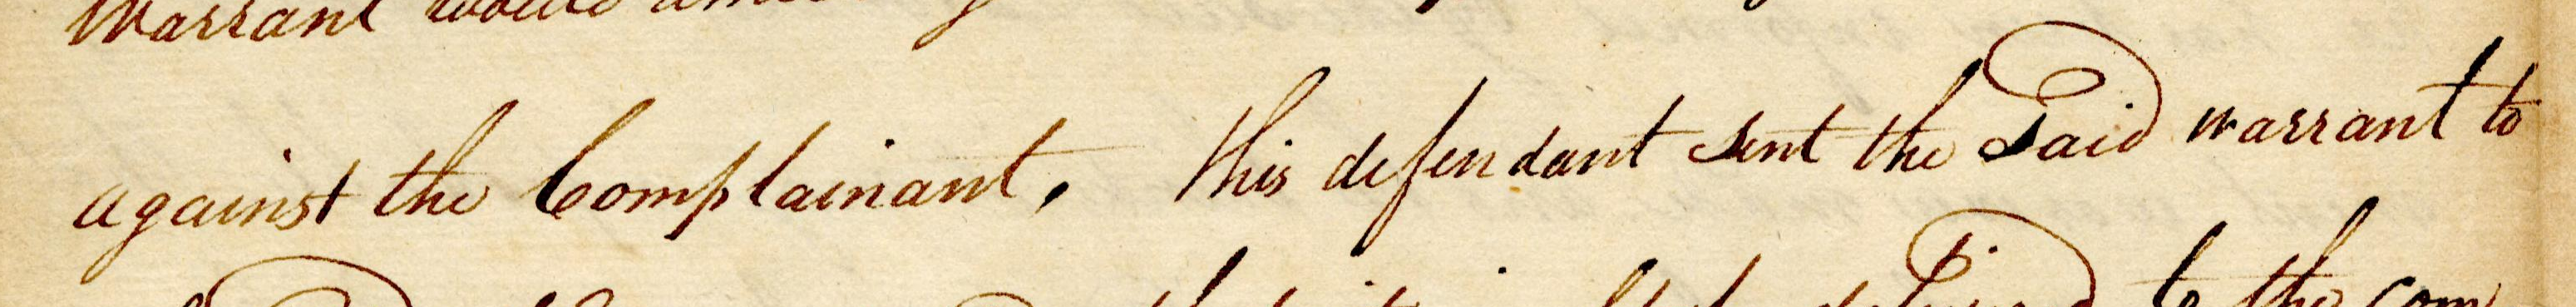against the Complainant, this defendant Sent the said warrant to
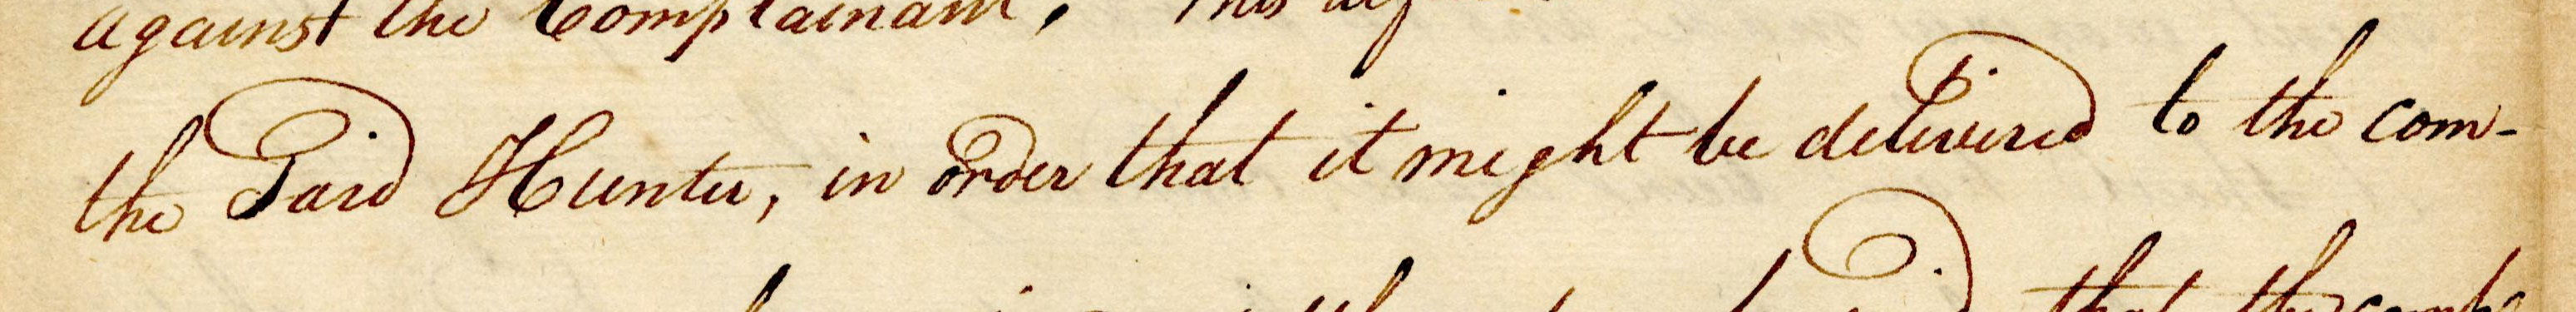the said Hunter, in order that it might be delivered to the com-
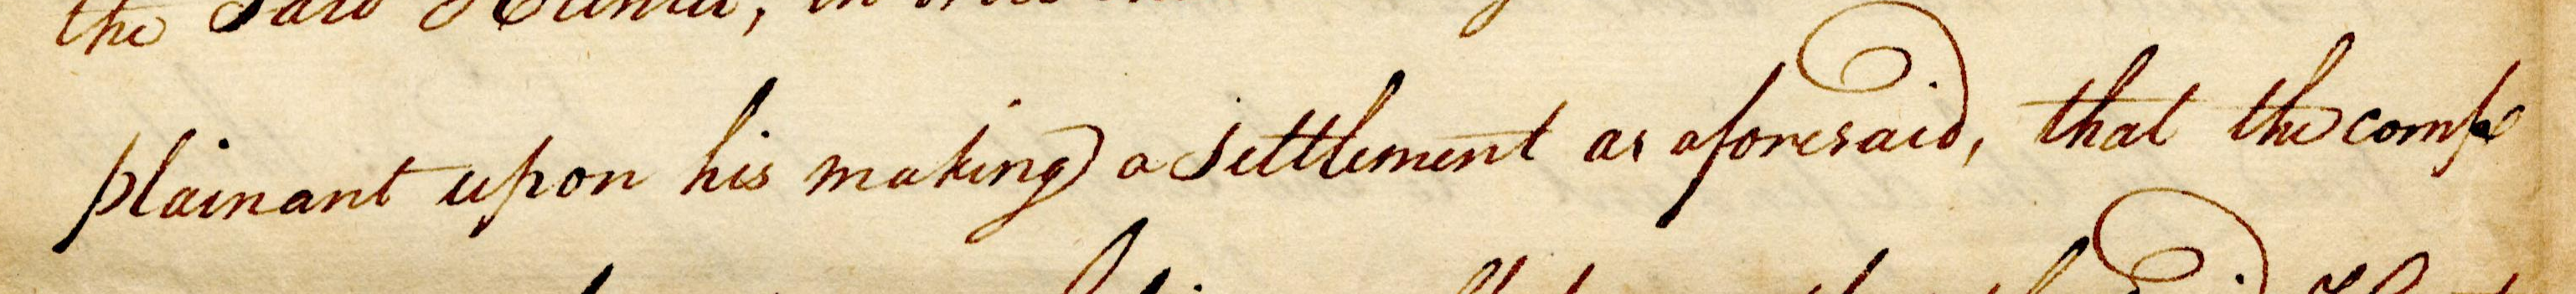-plainant upon his making a settlement as aforesaid, that the comp-
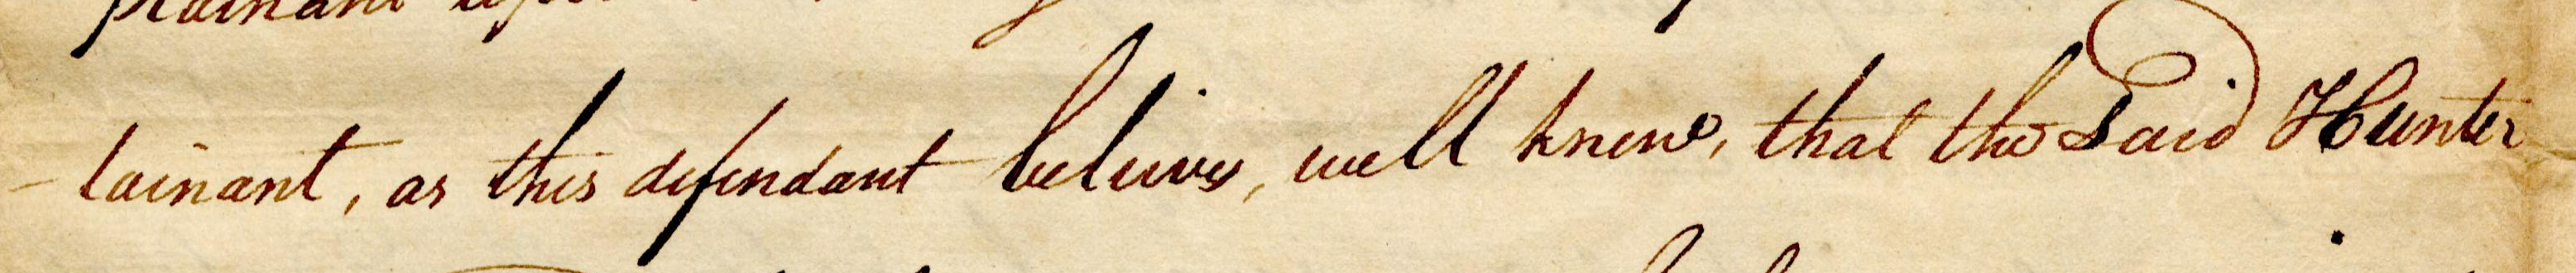-lainant, as this defendant believes, will know that the said Hunter
